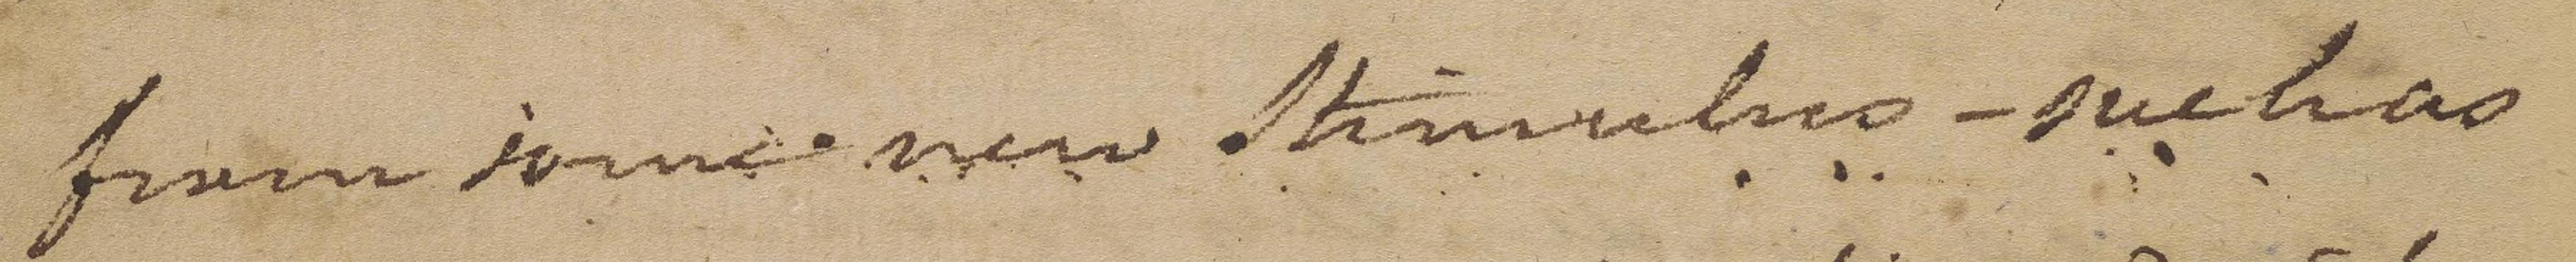from some new Stimulus has
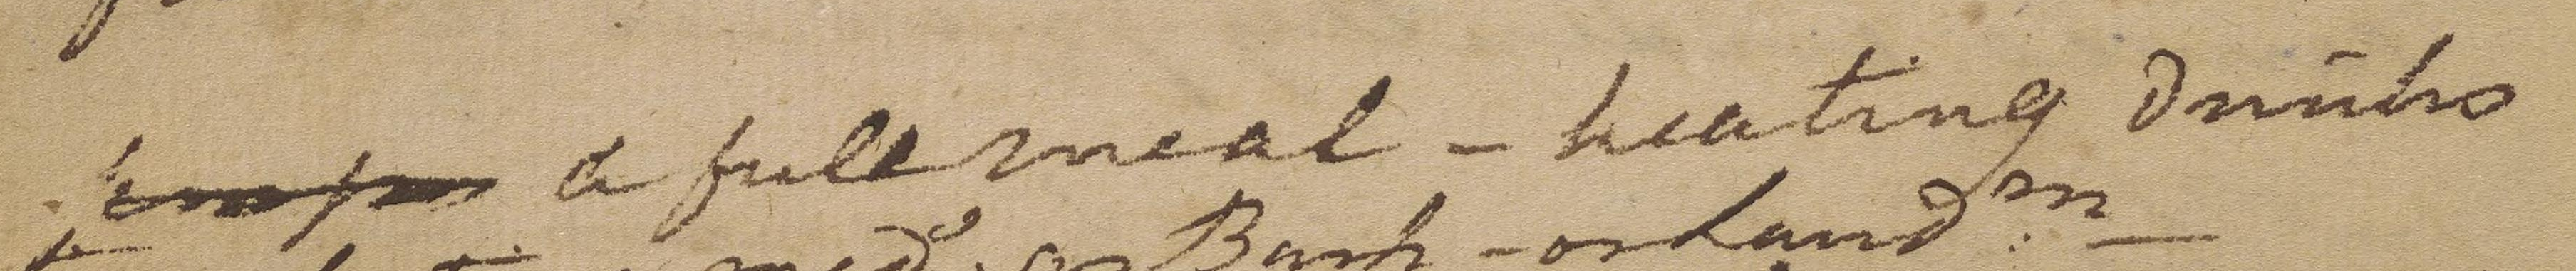[temper] a full meal- heating drinks,
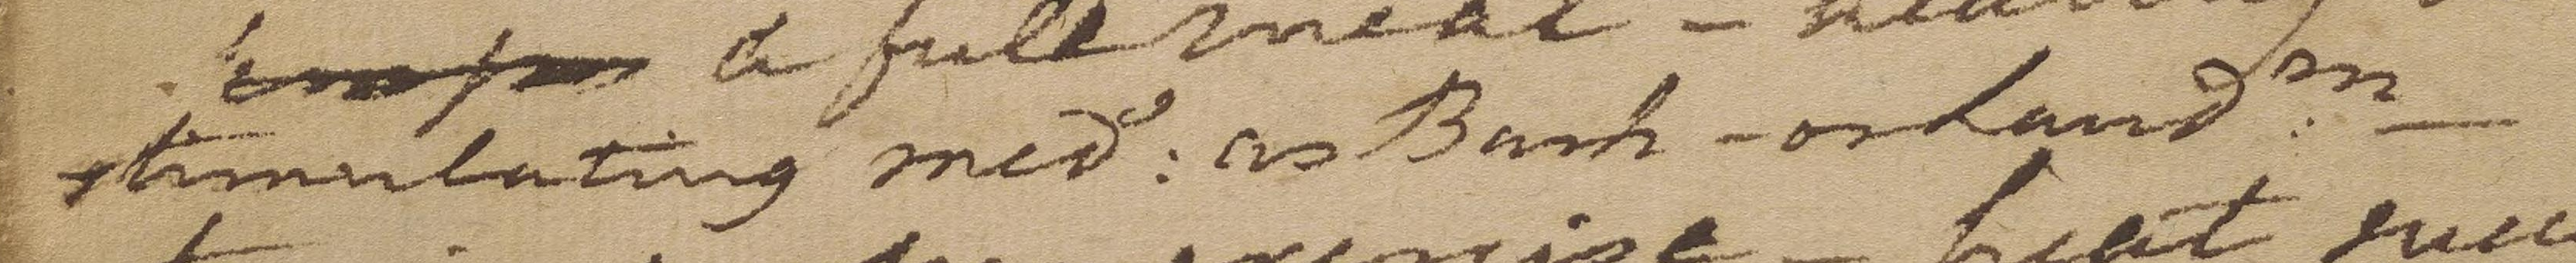stimulating med^g as Bark, or Land^on
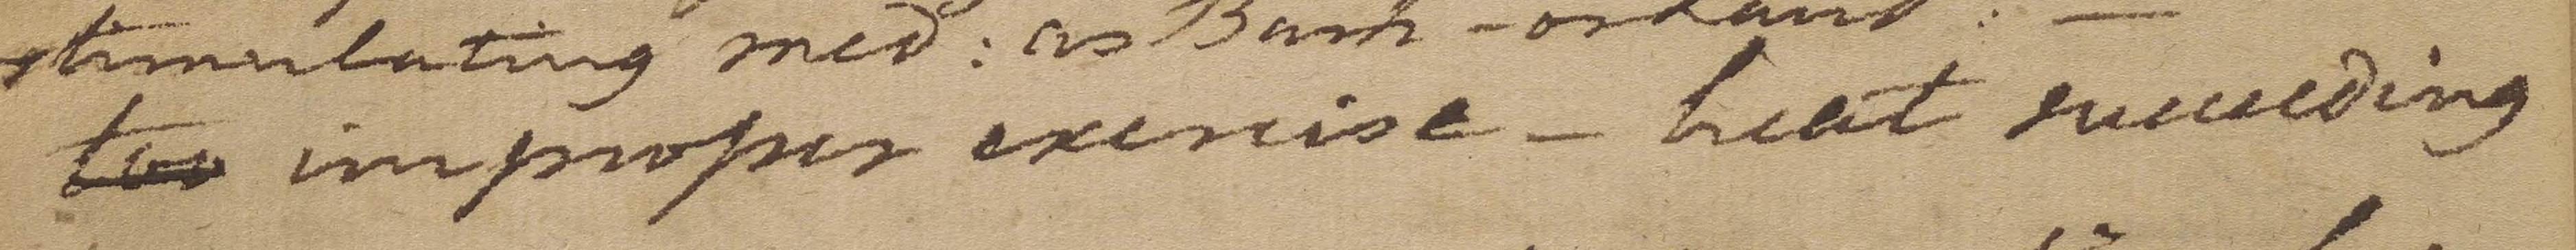[too] improper exercise, heat succeeding
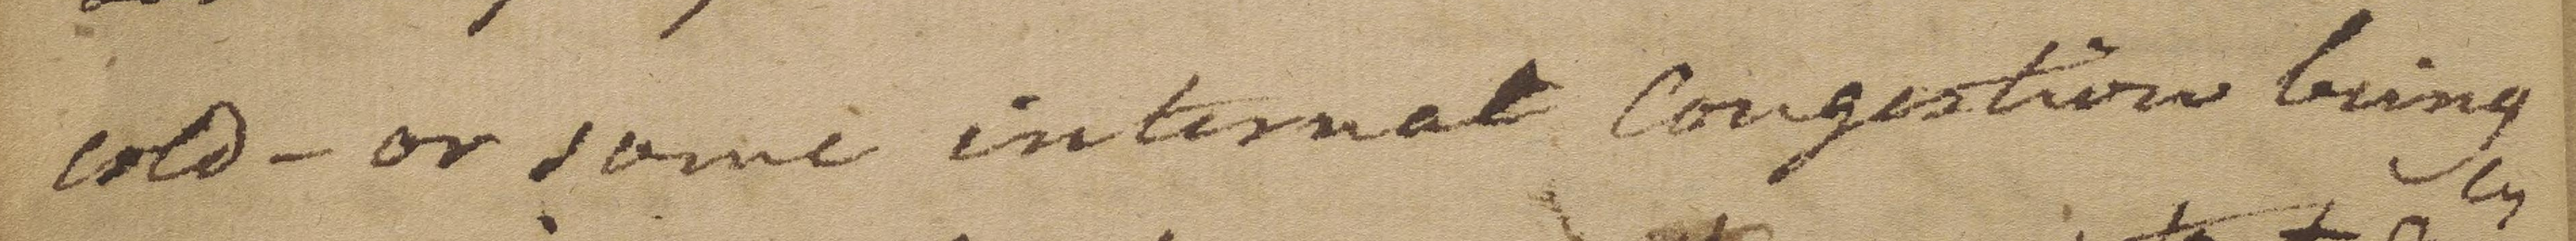cold- or some internal congestion being
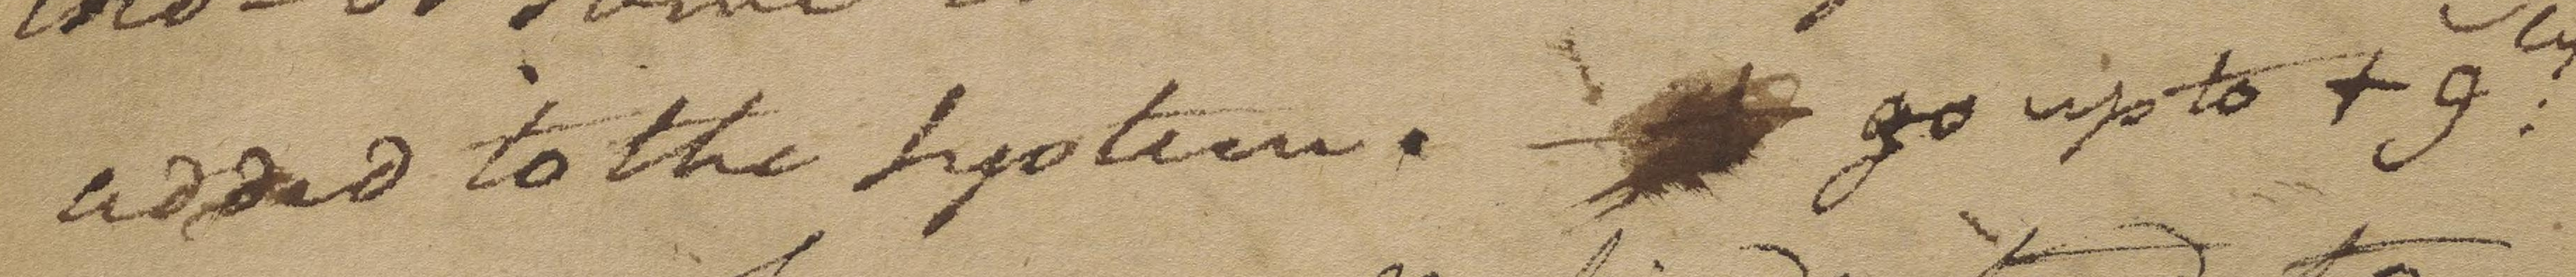added to the System. go up to +9^ly
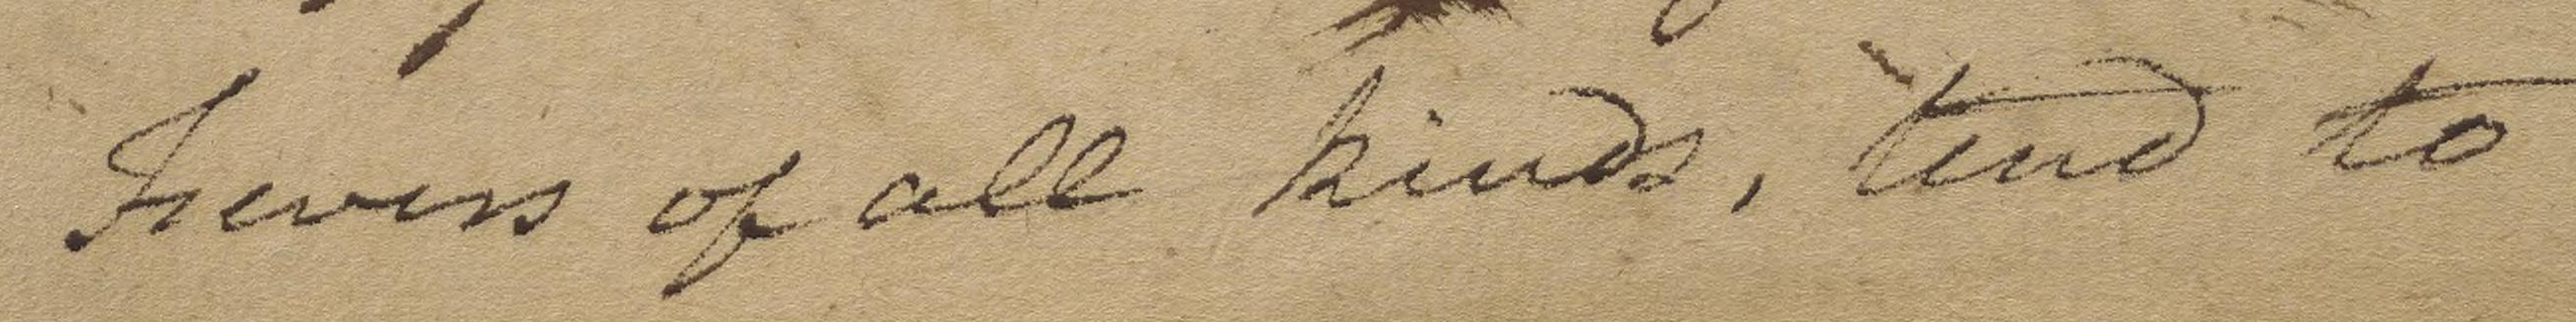Fevers of all kinds, tend to
